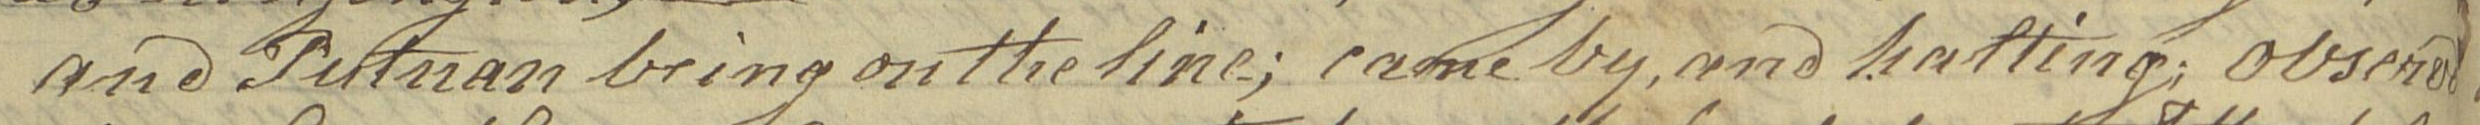and Putnam being on the line; came by, and hasting; observ-
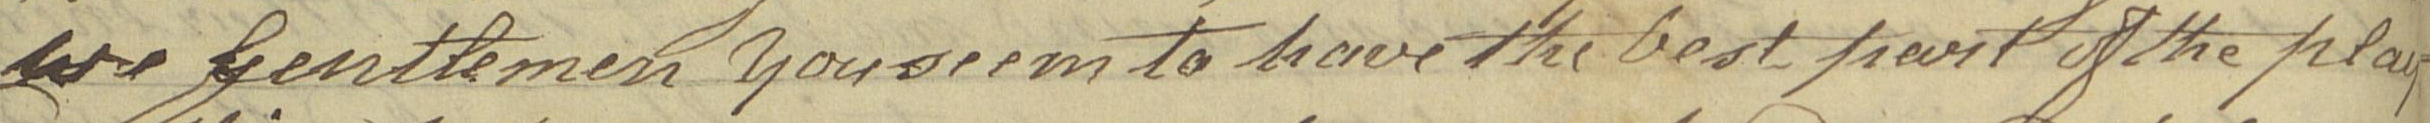we Gentlemen you seem to have the best part of the play
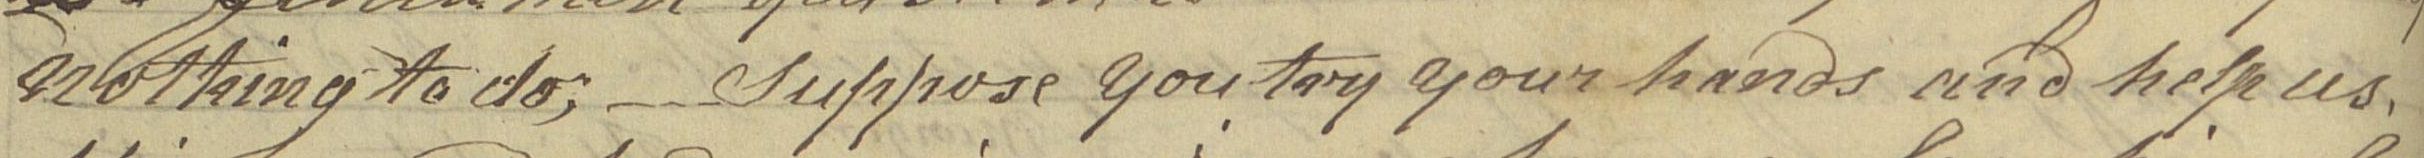nothing to do; Suppose you try your hands and help us,
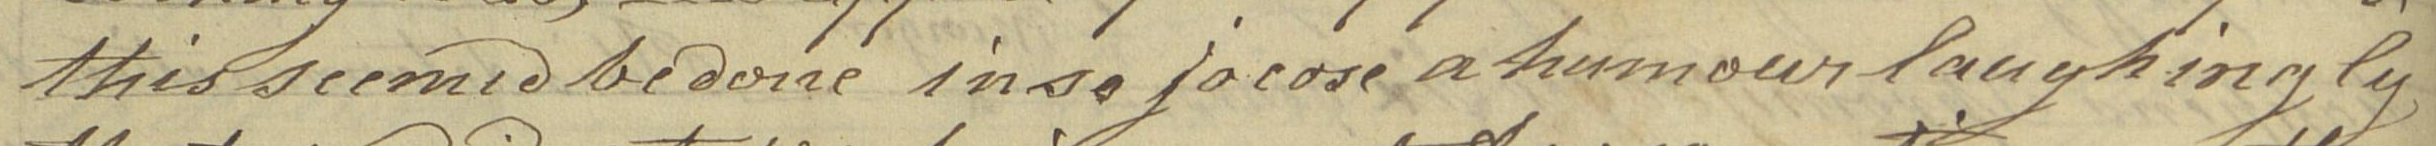this seemed bedone in so jocose a humour laughingly
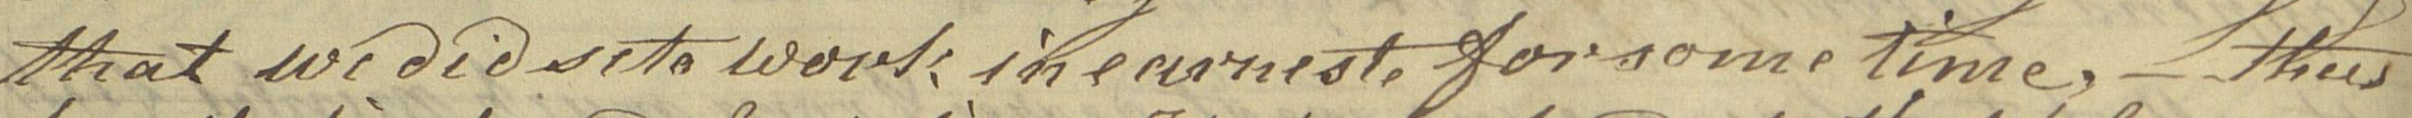that we did seto work in earnest for some time, thus
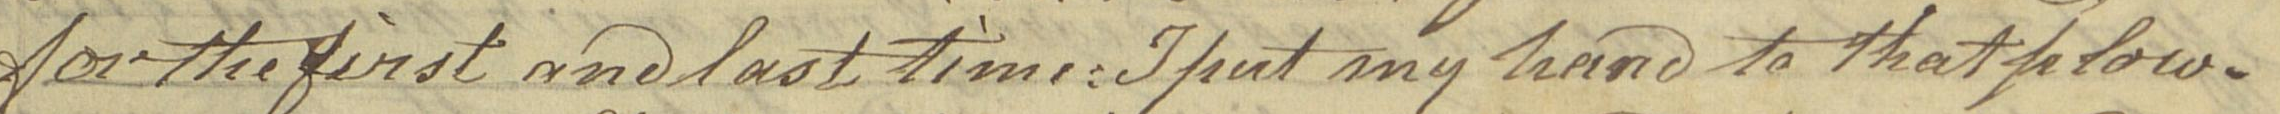for the first and last time: I put my hand to that plow.
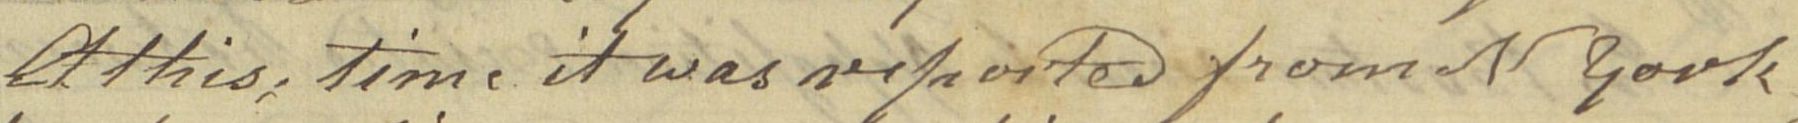At this time it was reported from N York
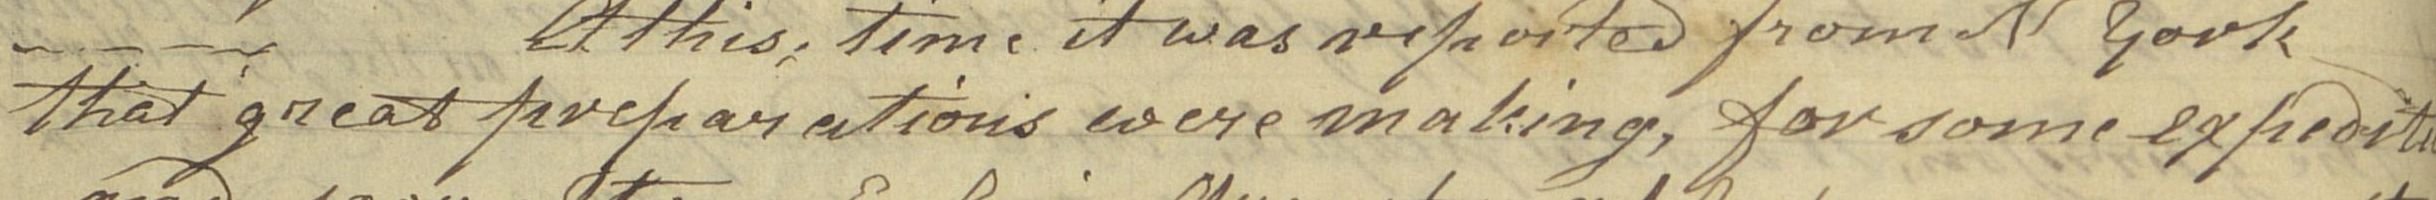that great preparations were making, for some expediti-
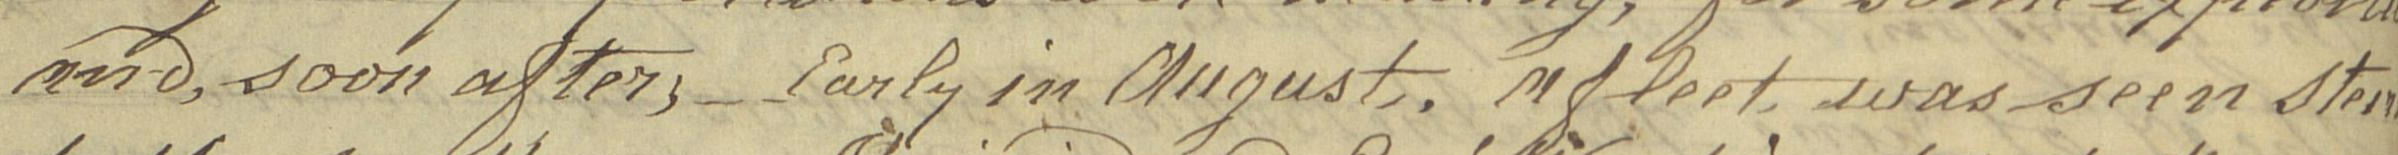and soon after, Early in August, a fleet was seen stern
